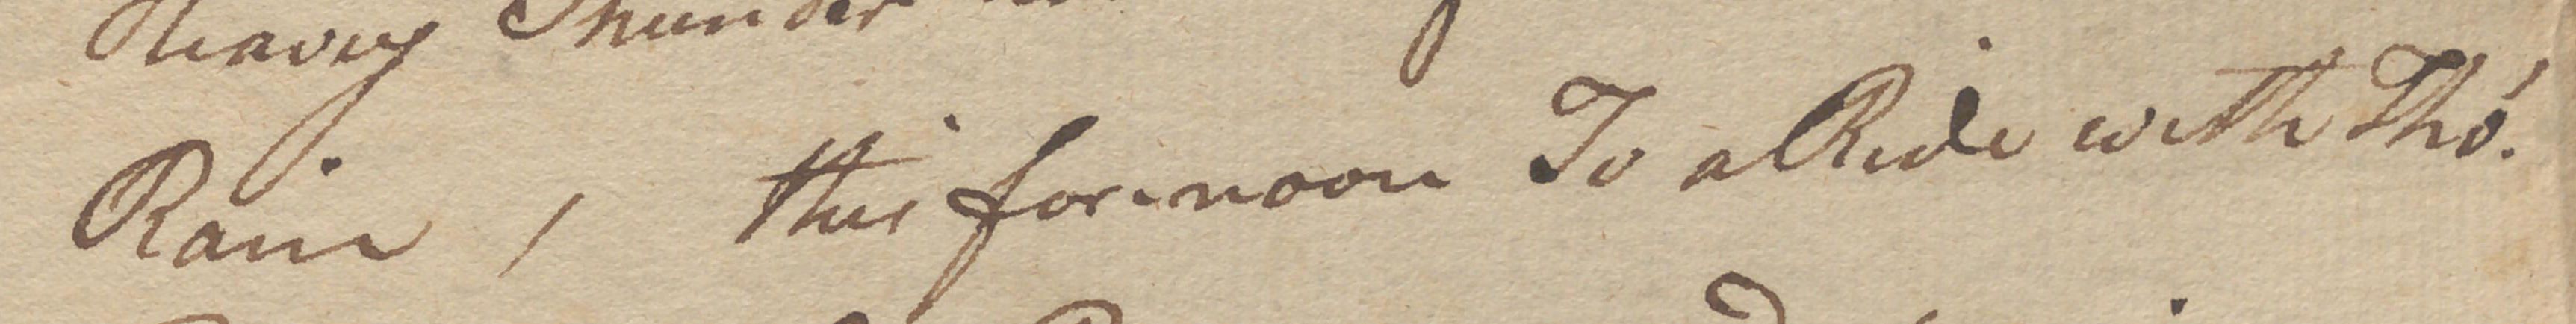Rain, this forenoon To a Ride with Tho^s.
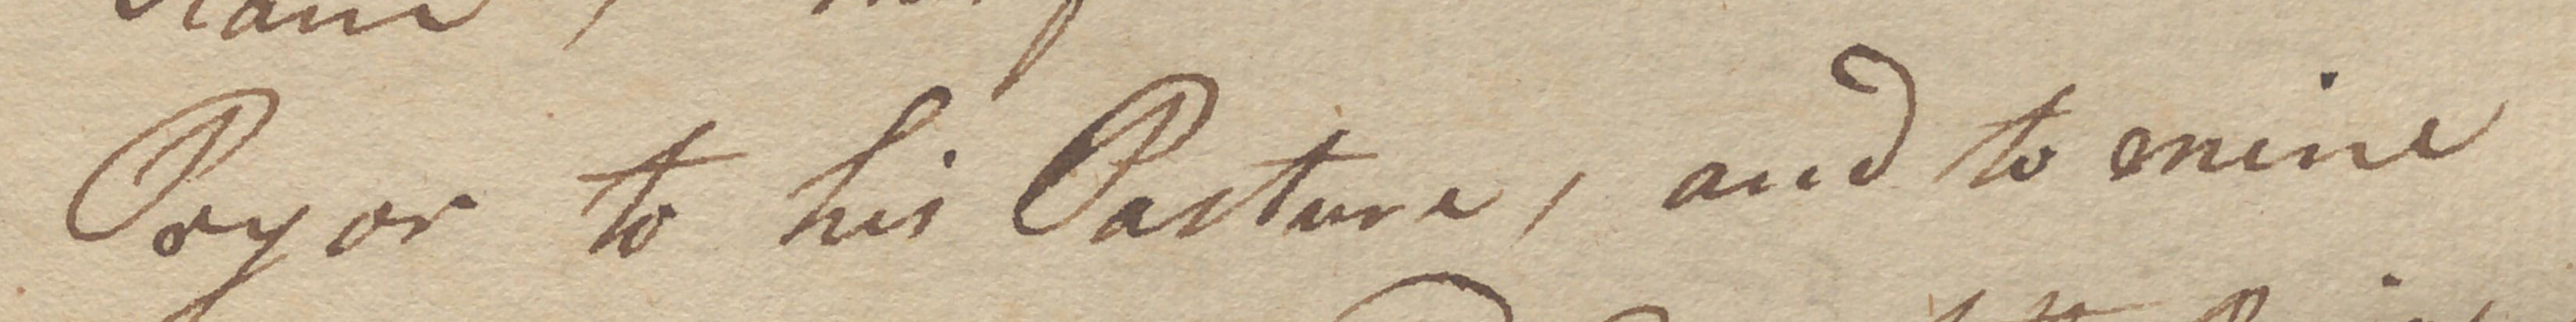Pryor to his Pasture, and to mine
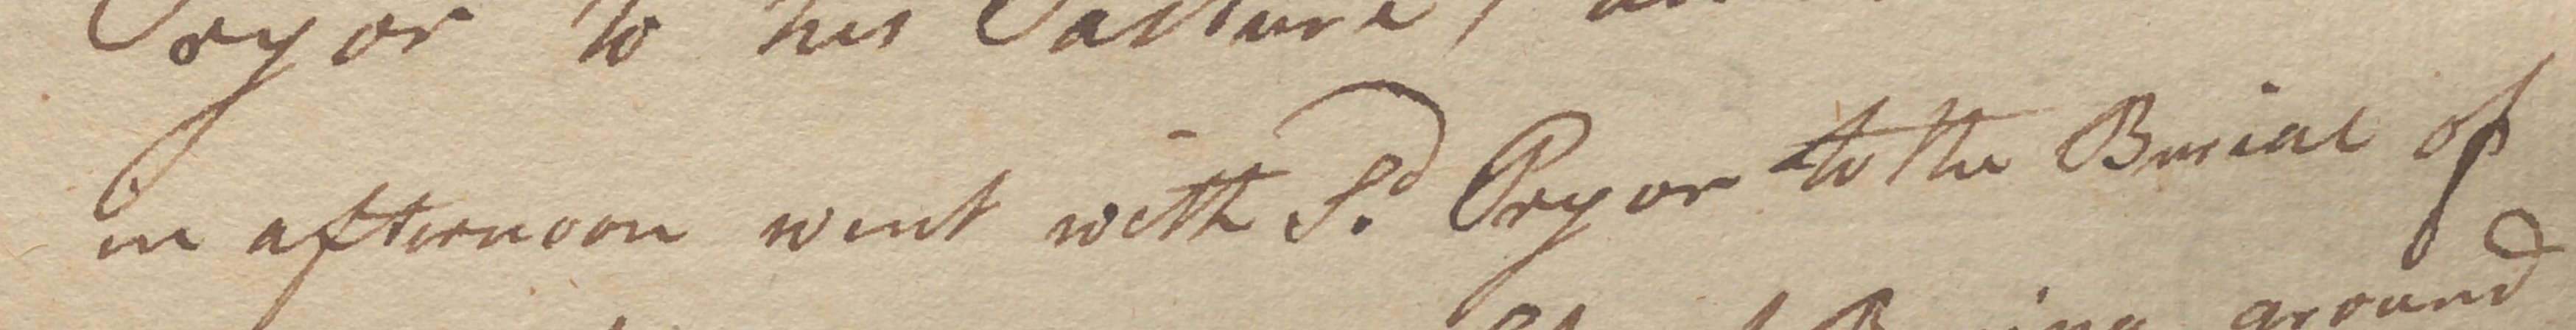in afternoon went with s^d. Pryor to the Burial of
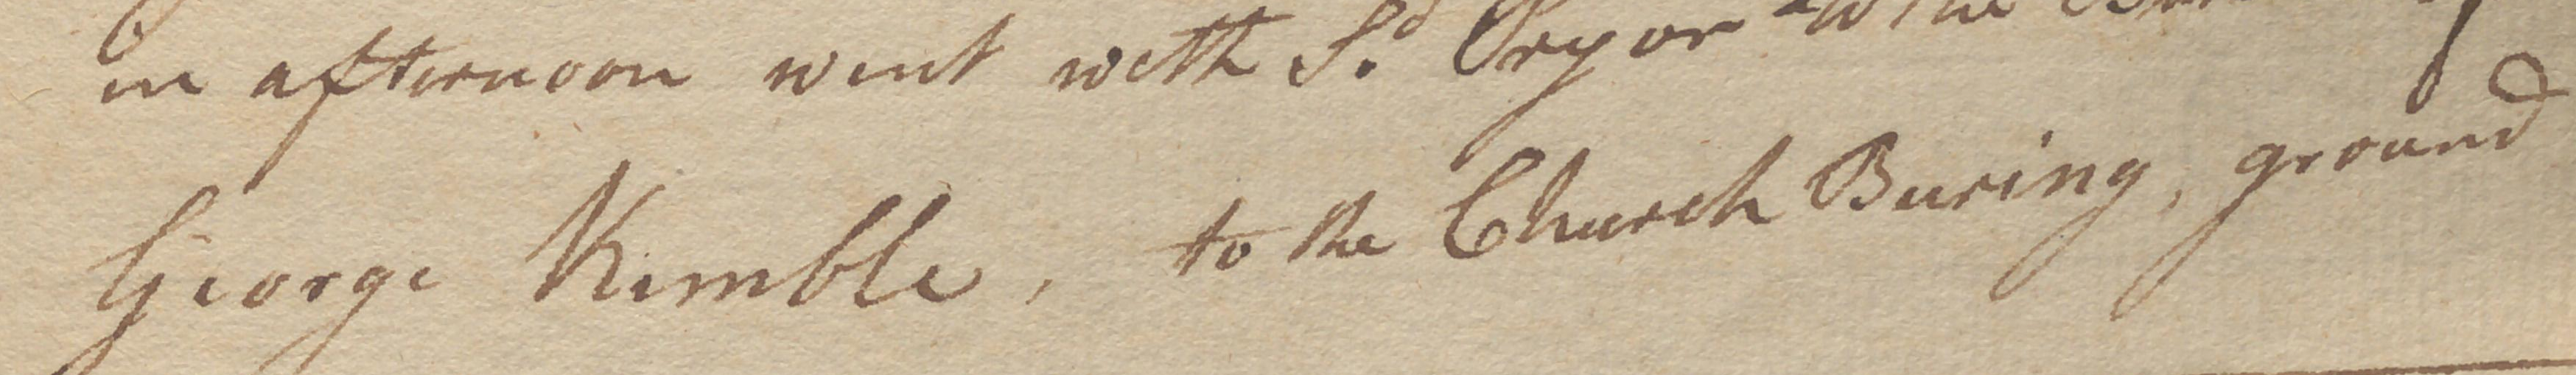George Kimble, to the Church Buring, ground
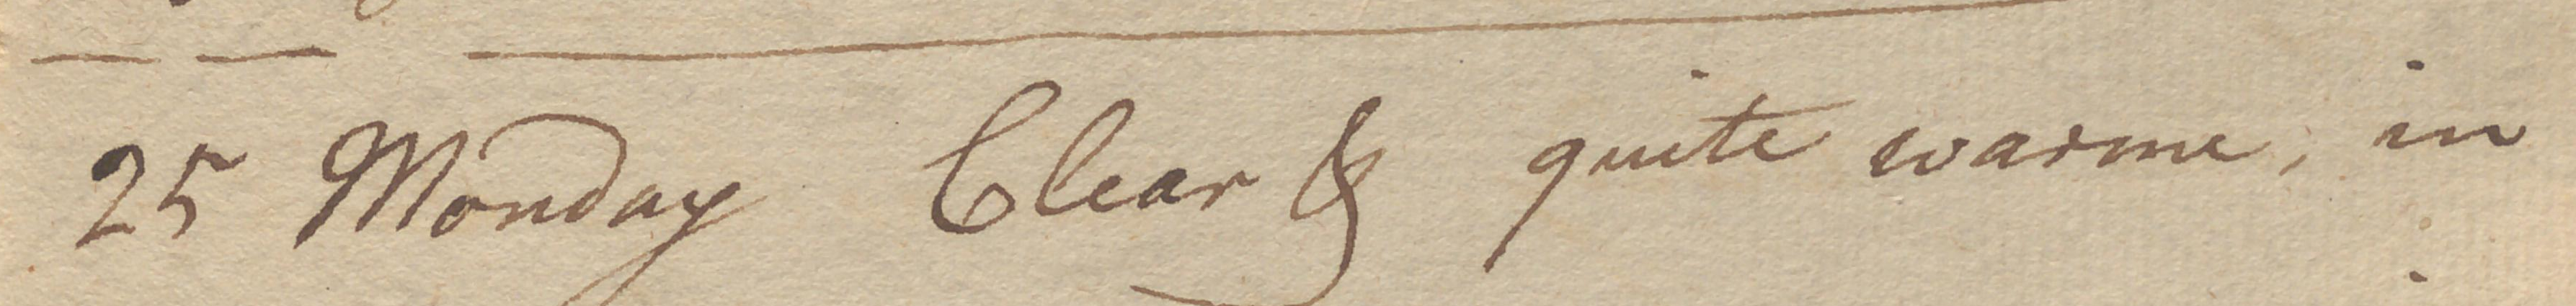25 Monday Clear & quite warme, in
